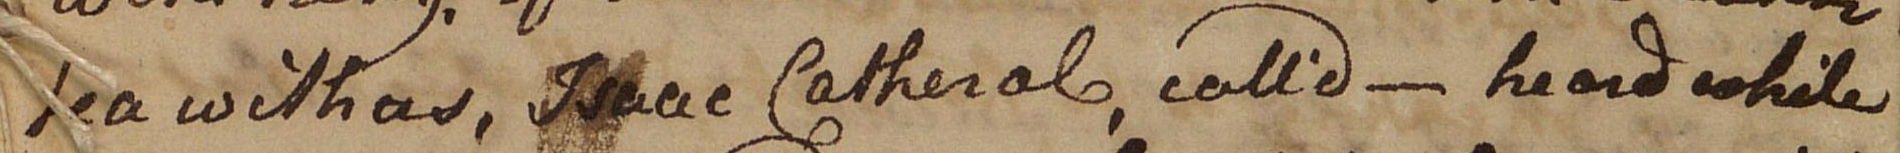tea with us, Isaac Catheral call'd- heard while
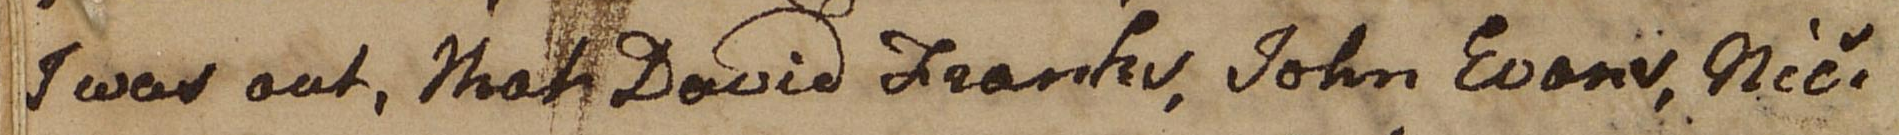I wes out, that David Franks, John Evans, Nic^s.
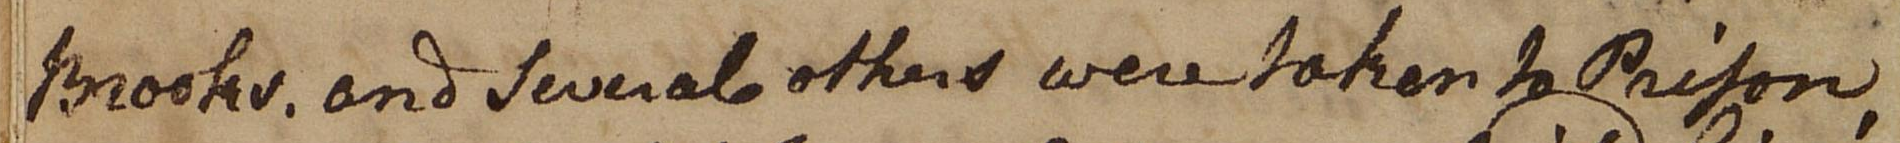Brooks, and several others were taken to Prison,
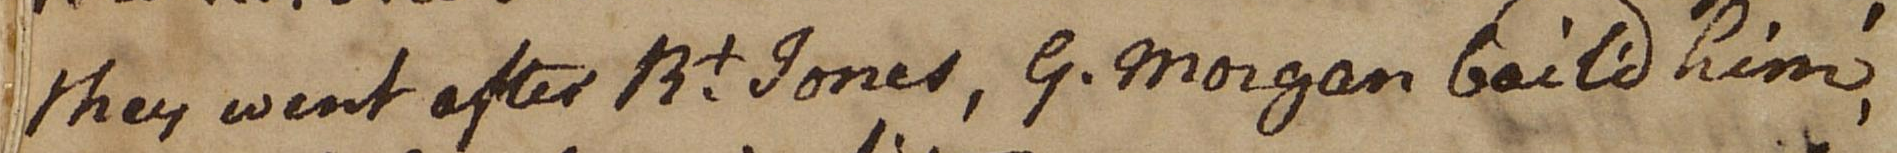they went after R^t. Jones, G. Morgan bail'd him,
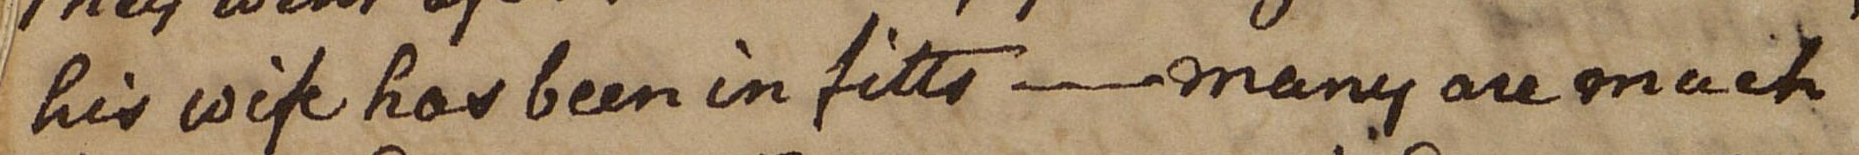his wife has been in fitts- many are much
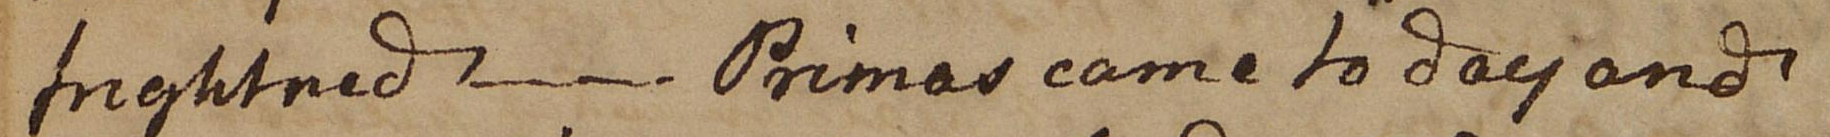frightned-- Primas came to day and
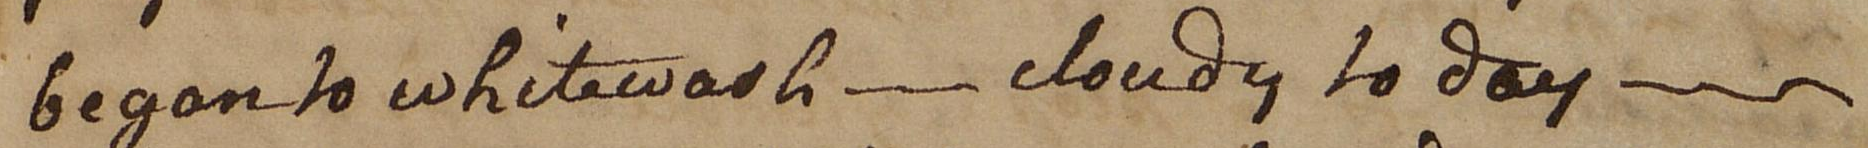began to whitewash- cloudy to day-
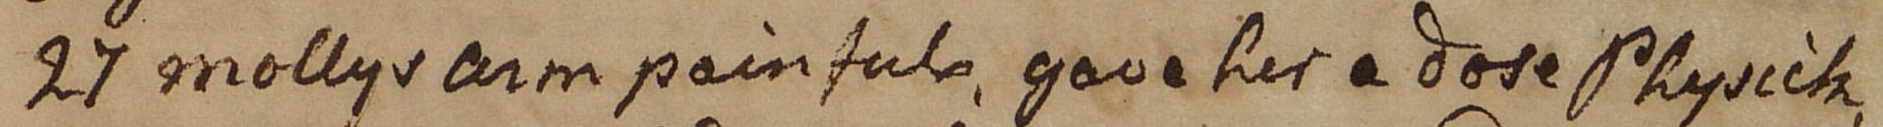27 Mollys Arm painful, gave her a dose Physick,
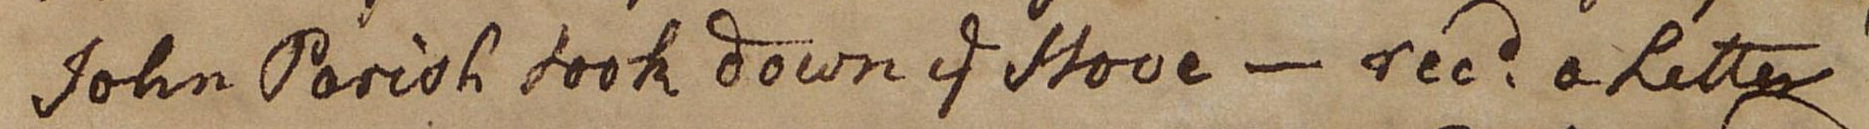John Parish took down y^e Stove- rec^d. a Letter
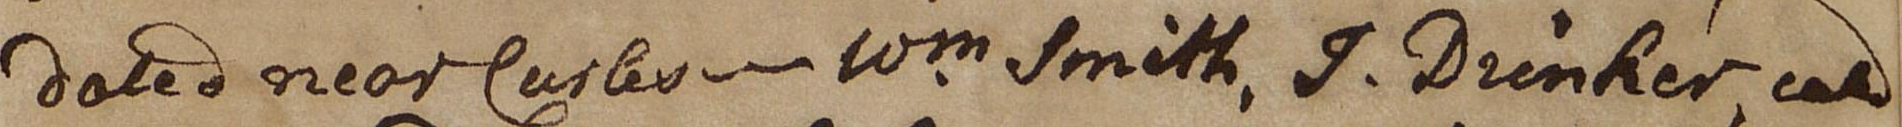dated near Curles- W^m. Smith, I. Drinker, cald
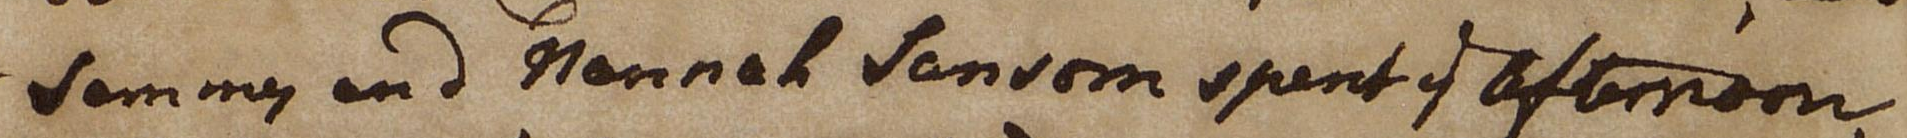Sammy and Hannah Sansom spent y^e afternoon,
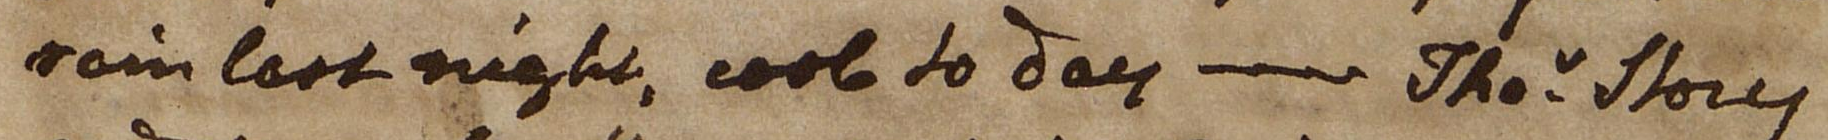rain last night, cool to day- Tho^s. Story
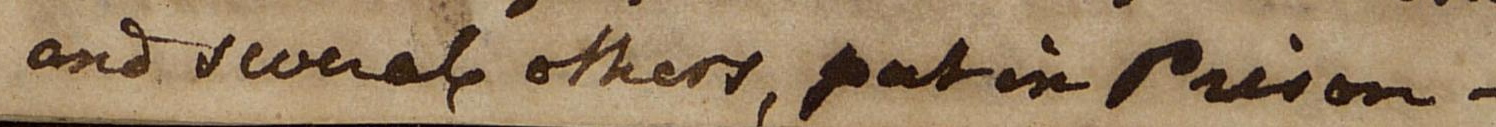and several others, put in Prison-
